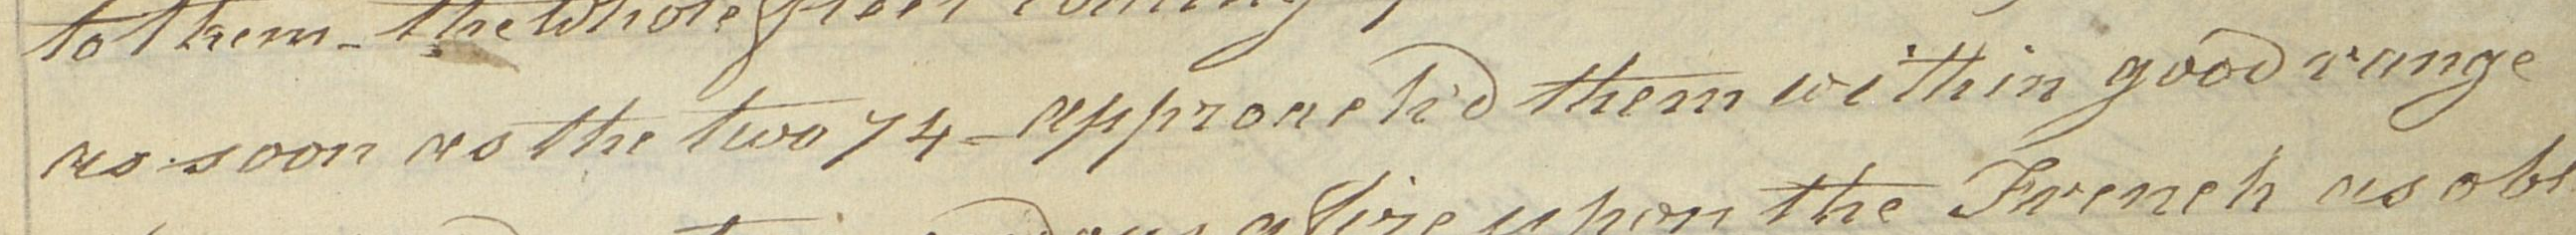as soon as the two 74 approach'd them within good range
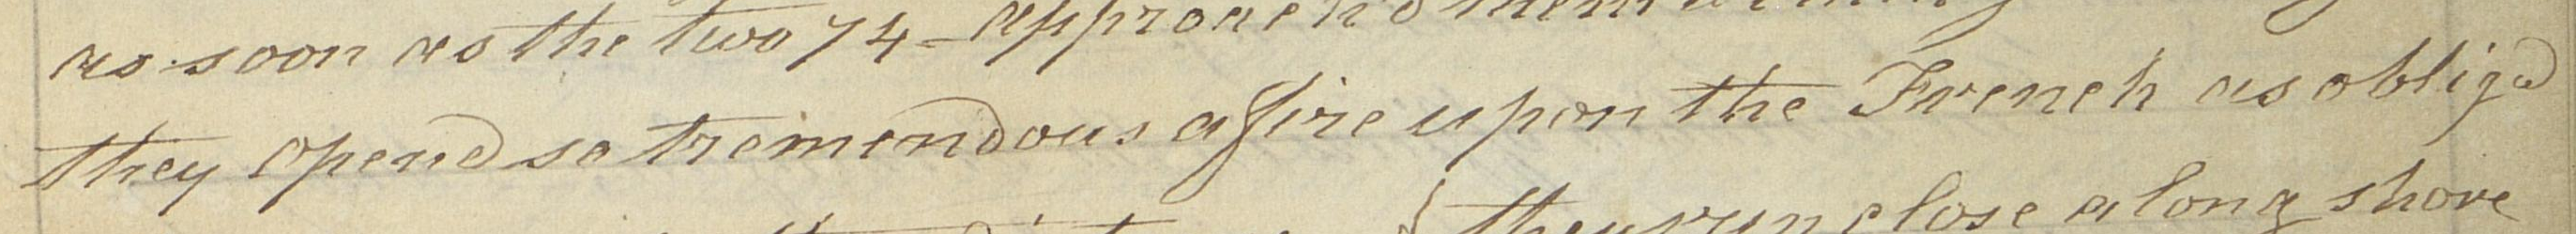they opend so tremendous a fire upon the French as obligd
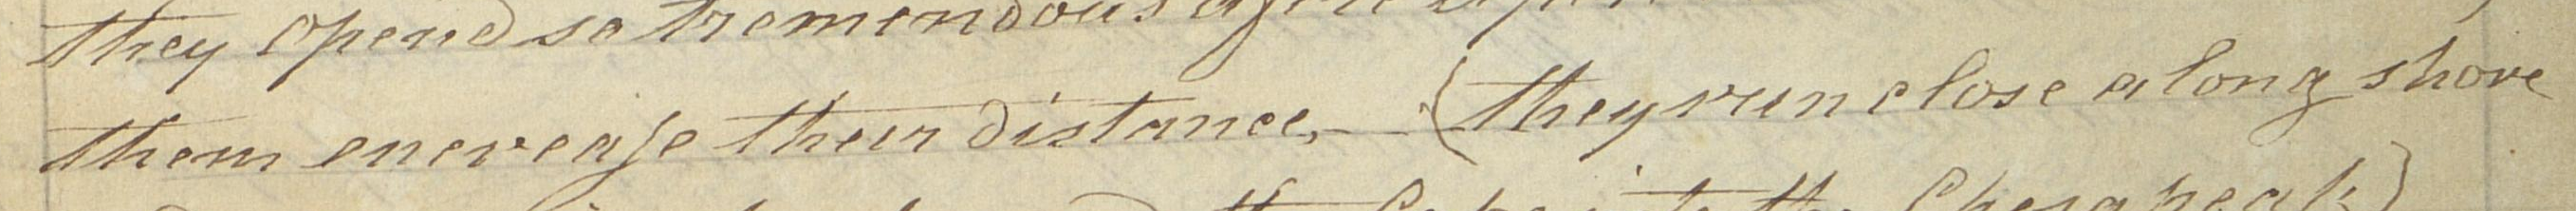them encrease their distance, (they run close along shove
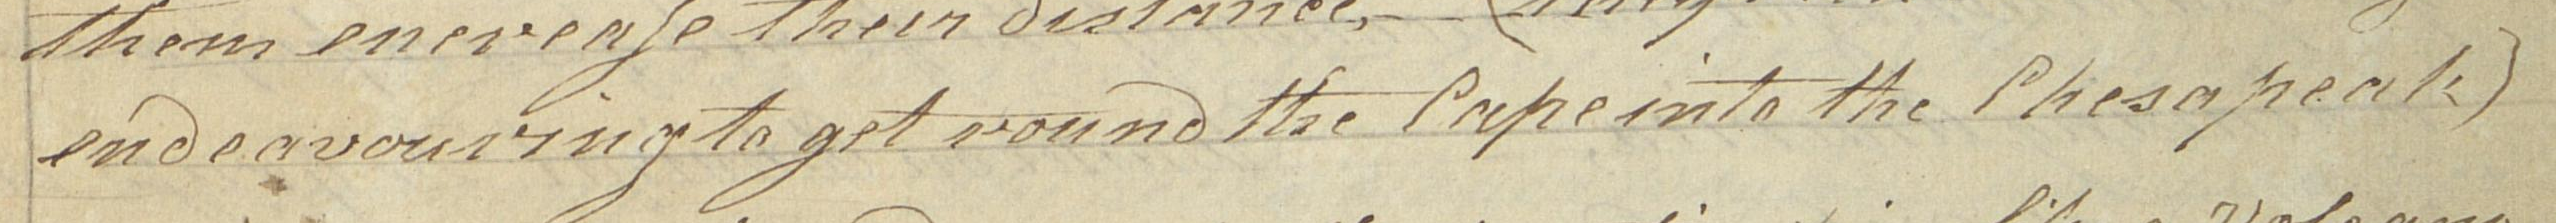endeavouring to get round the Cape into the Chesapeak)
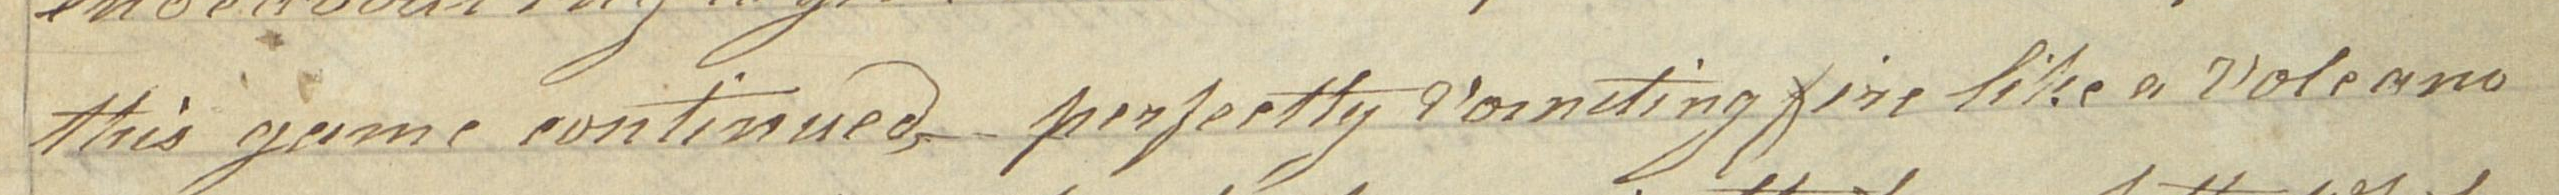this game continued, perfectly vomiting fire like a Volcano
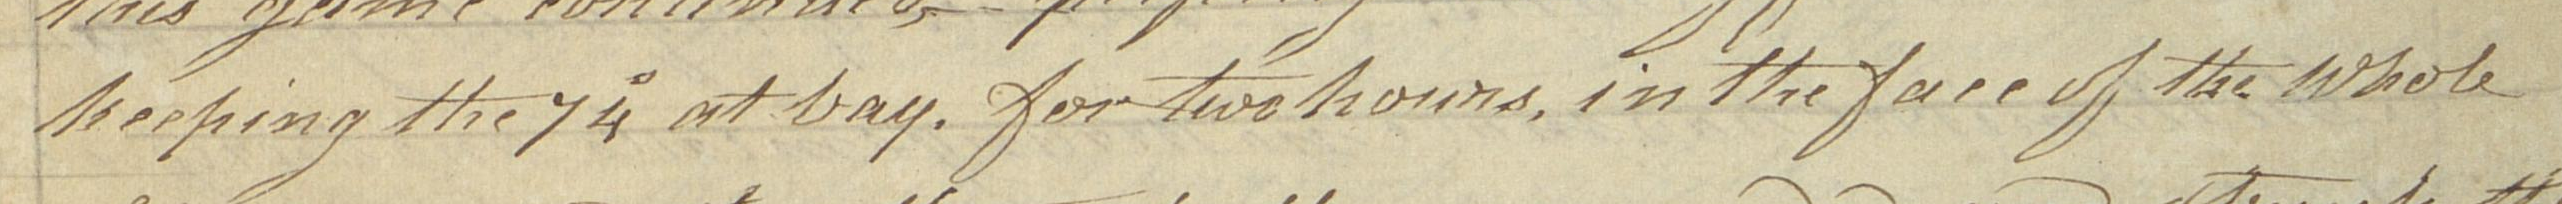keeping the 74 at bay. for two hours in the face of the Whole
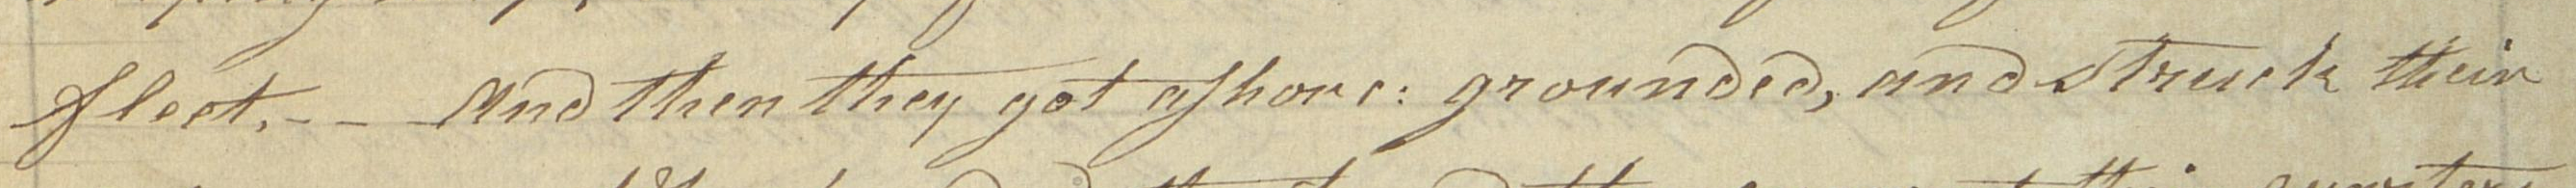fleet. And then they got ashore grounded, and struck their
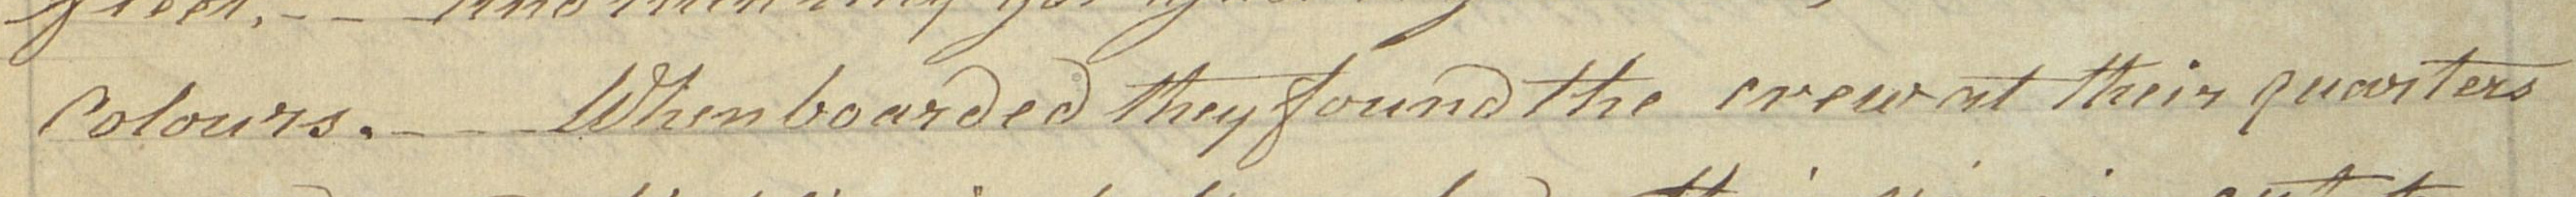Colours. When boarded they found the crew at their quarters
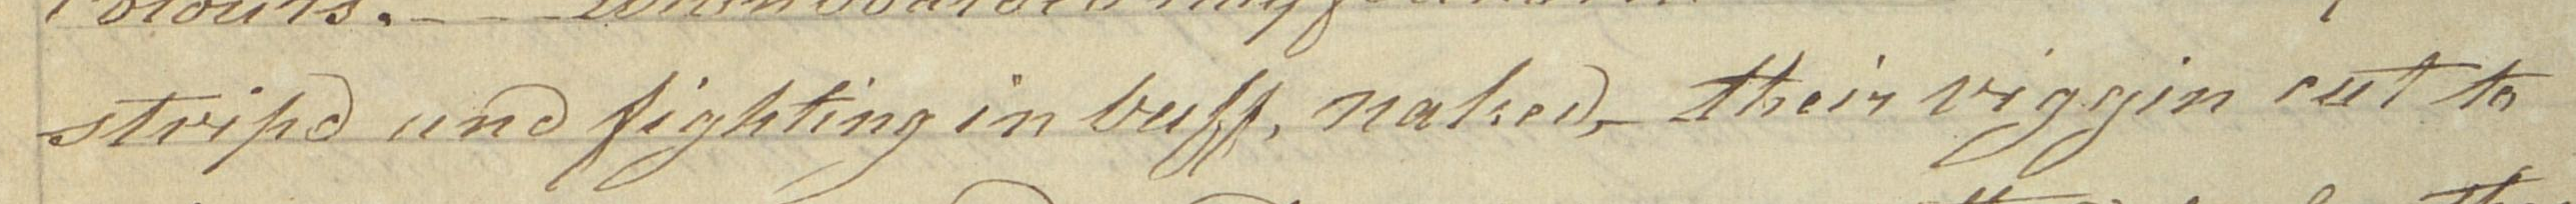stripd and fighting in buff, naked their riggin cut to
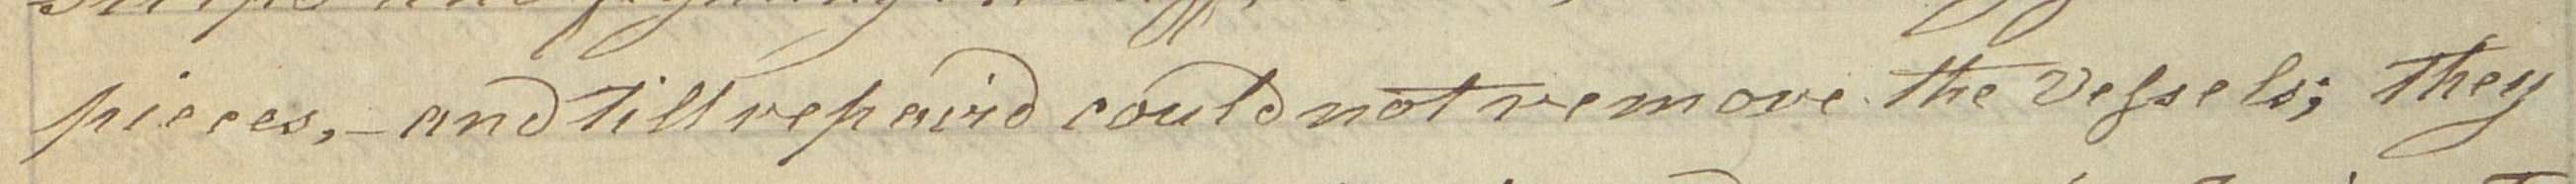pieces, and till repair'd could not remove the vessels; they
